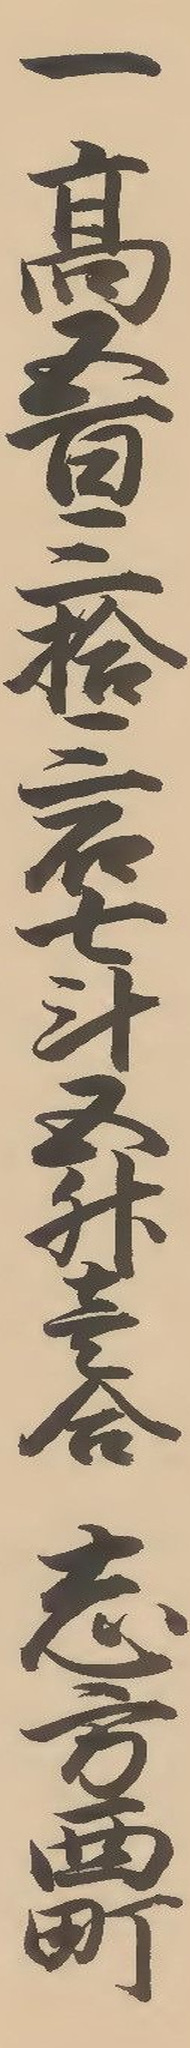一髙五百三拾三石七斗五升壱合志方西町
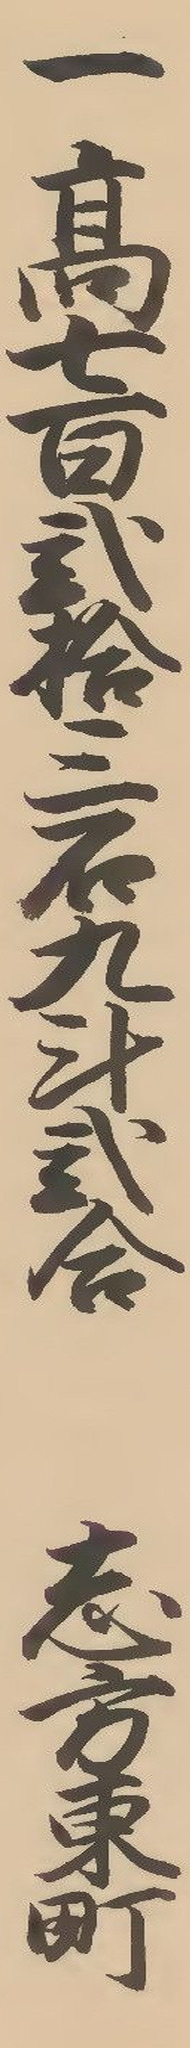一髙七百弐拾三石九斗弐合志方東町

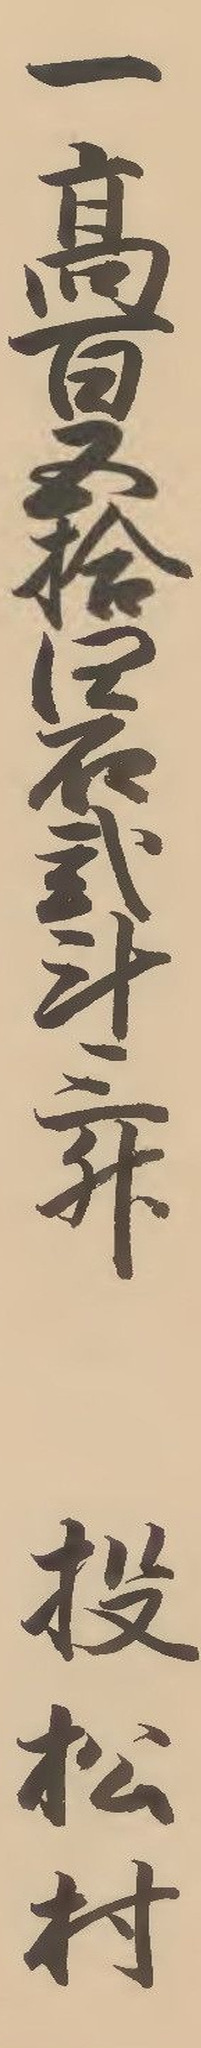一髙百五拾四石弐斗三升投松村
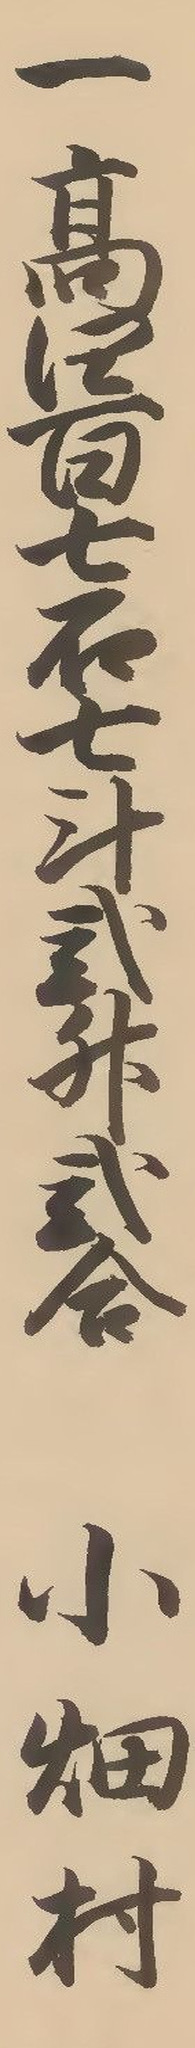一髙四百七石七斗弐升弐合小畑村
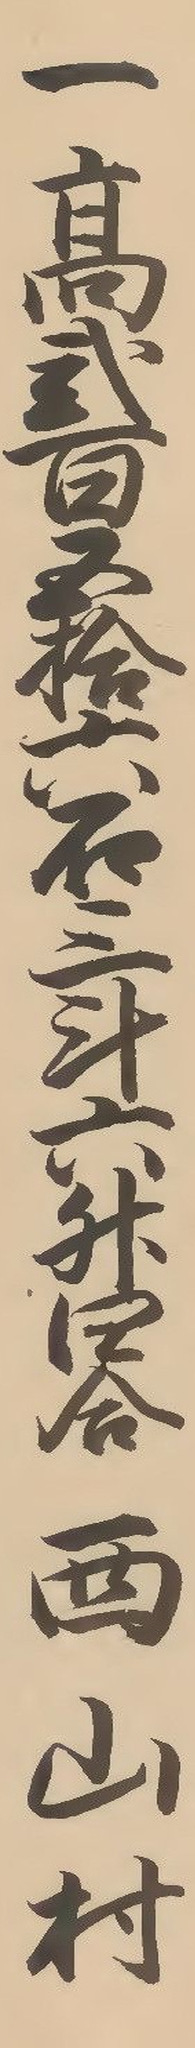一髙弐百五拾六石三斗六升四合西山村
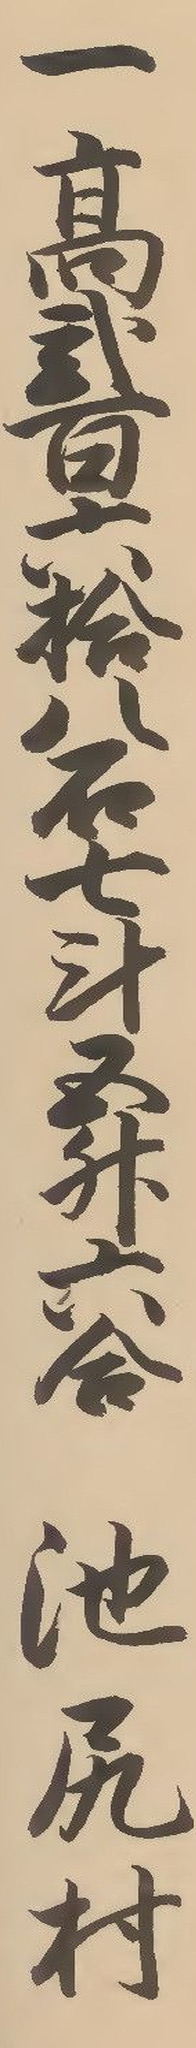一髙弐百六拾八石七斗五升六合池尻村
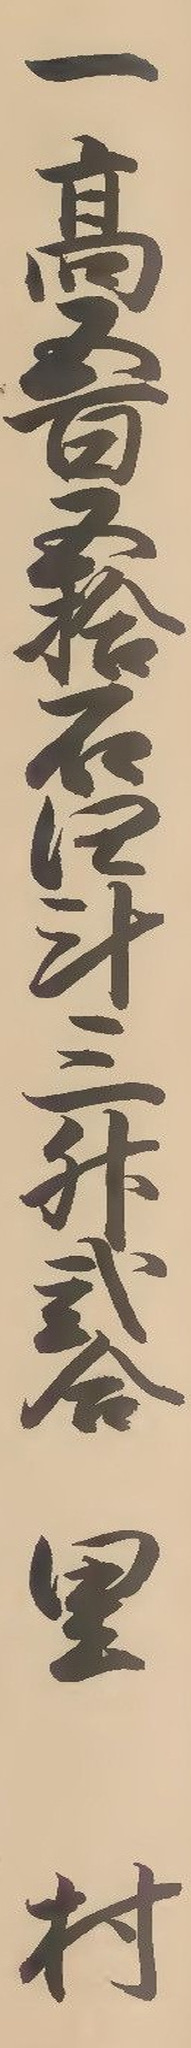一髙五百五拾石四斗三升弐合里村
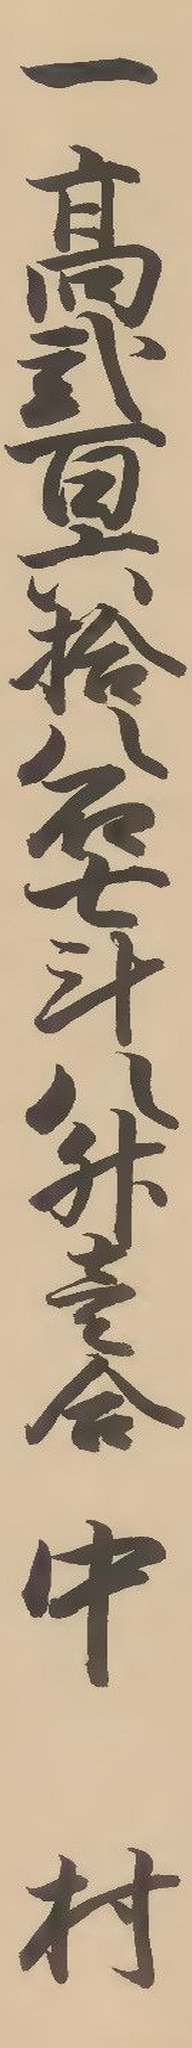一髙弐百六拾八石七斗八升壱合中村
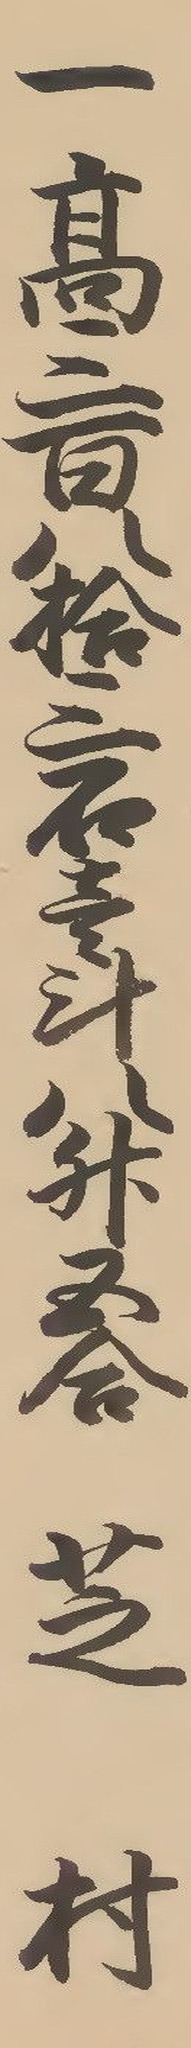一髙三百八拾三石壱斗八升五合芝村
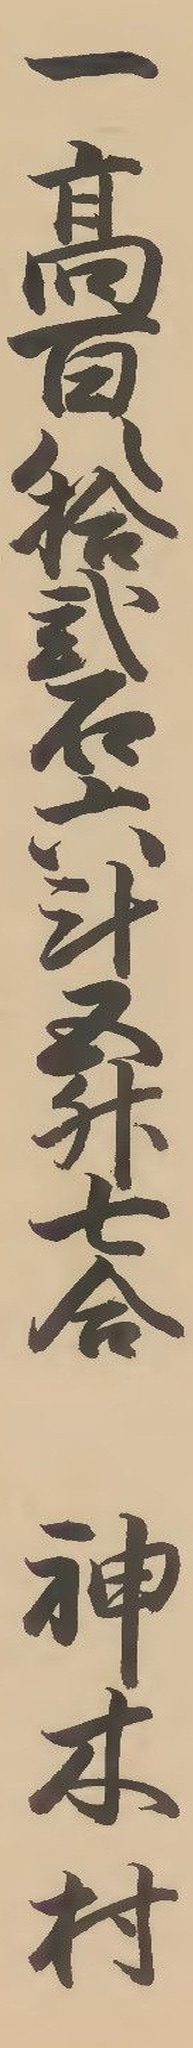一髙百八拾弐石六斗五升七合神木村

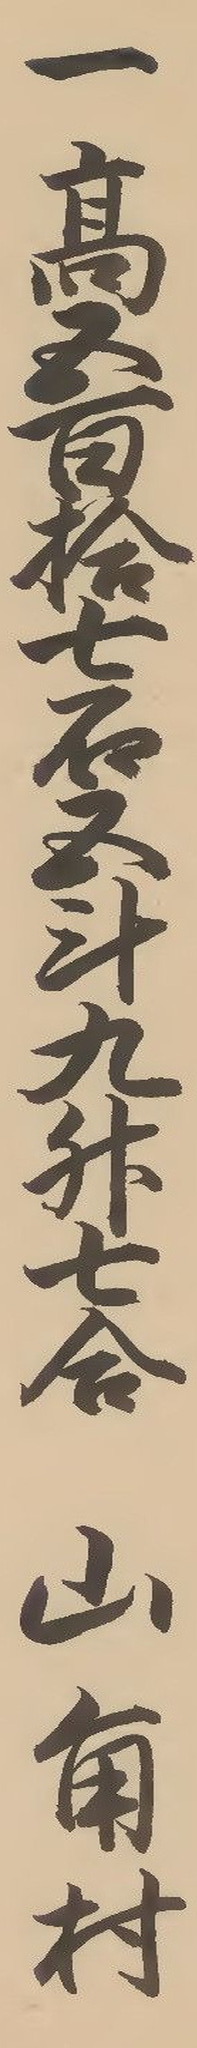一髙五百拾七石五斗九升七合山角村
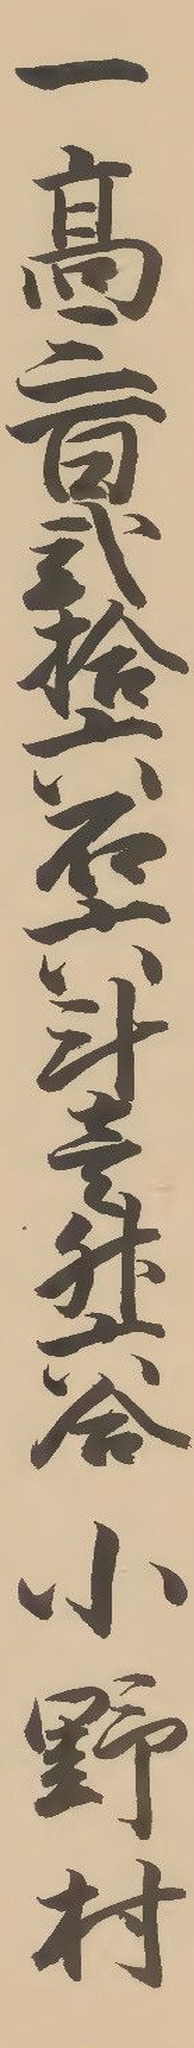一髙三百弐拾六石六斗壱升六合小野村
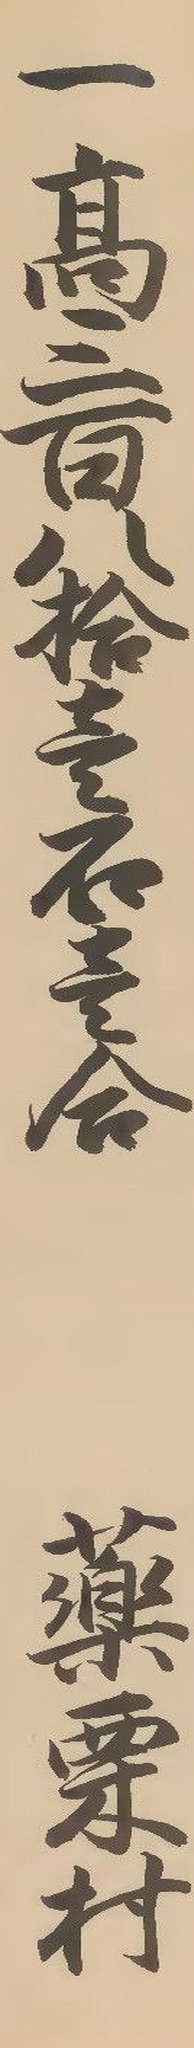一髙三百八拾壱石壱合藥栗村
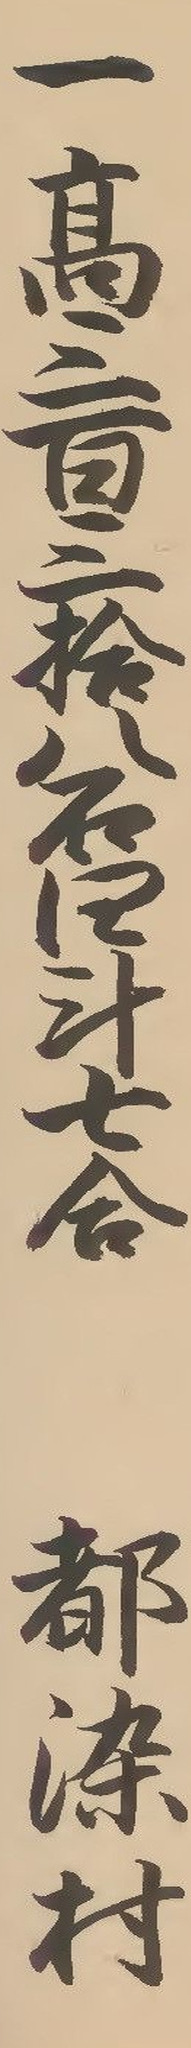一髙三百三拾八石四斗七合都染村
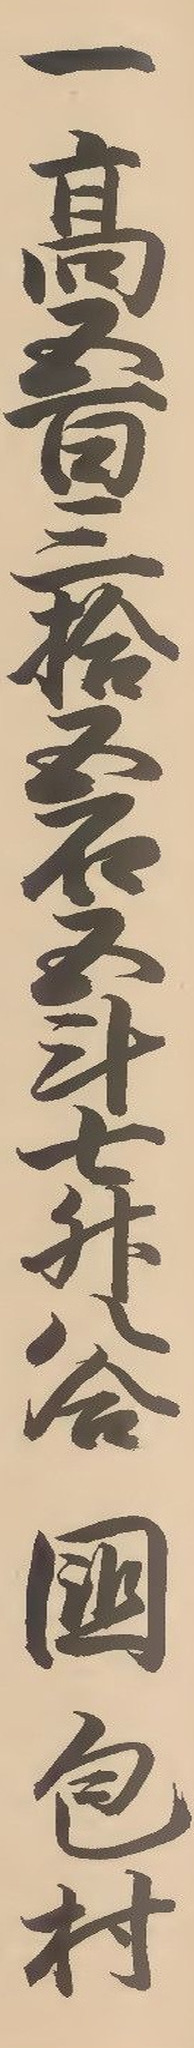一髙五百三拾五石五斗七升八合國包村
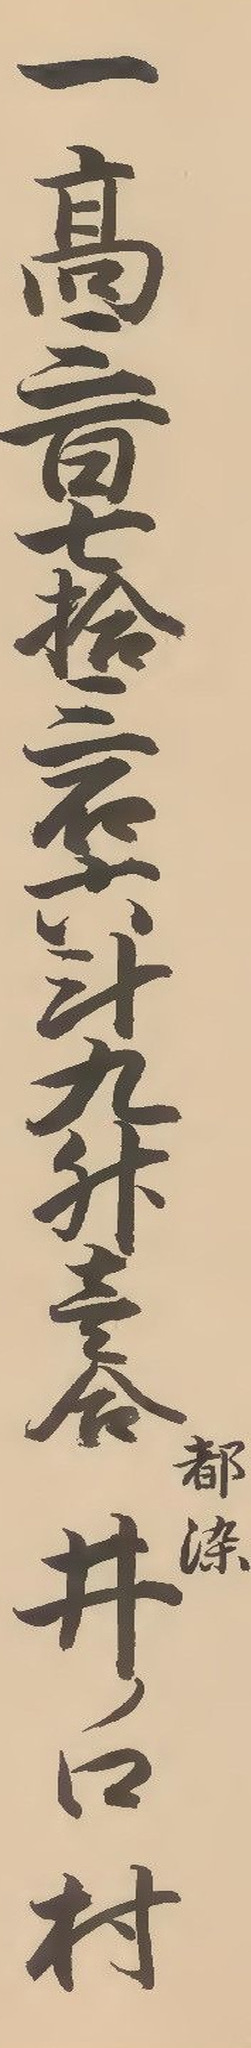一髙三百七拾三石六斗九升壱合井ノ口村
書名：播磨国郷帳
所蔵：国立公文書館 National Archives of Japan
